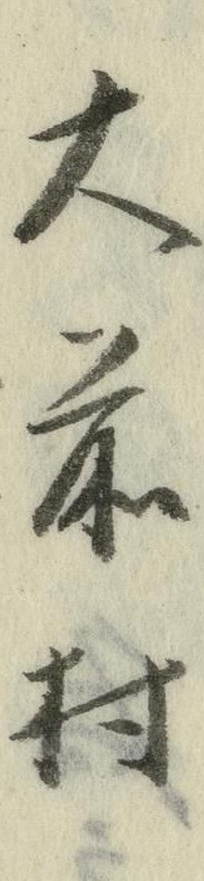大前村
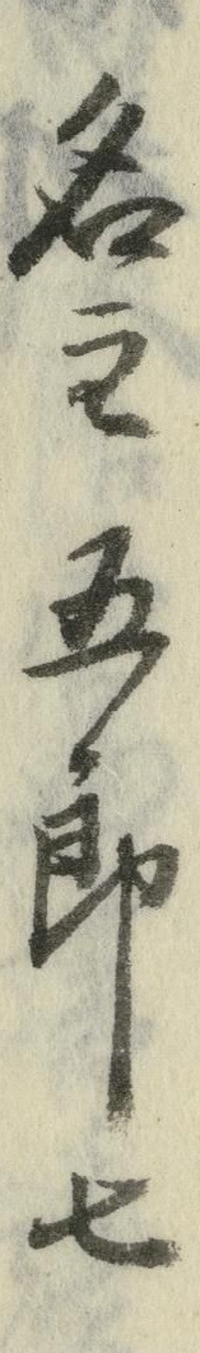名主五郎七

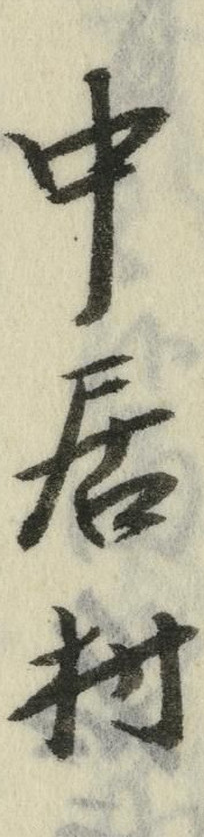中居村
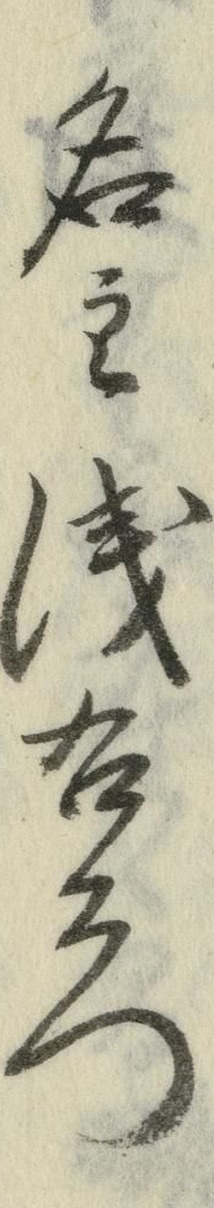名主浅右衛門
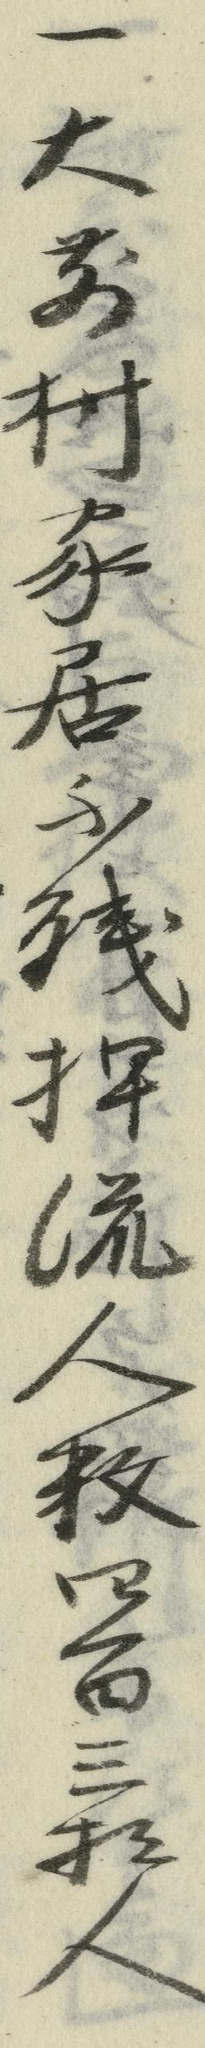一大前村家居不残押流人数四百三拾人
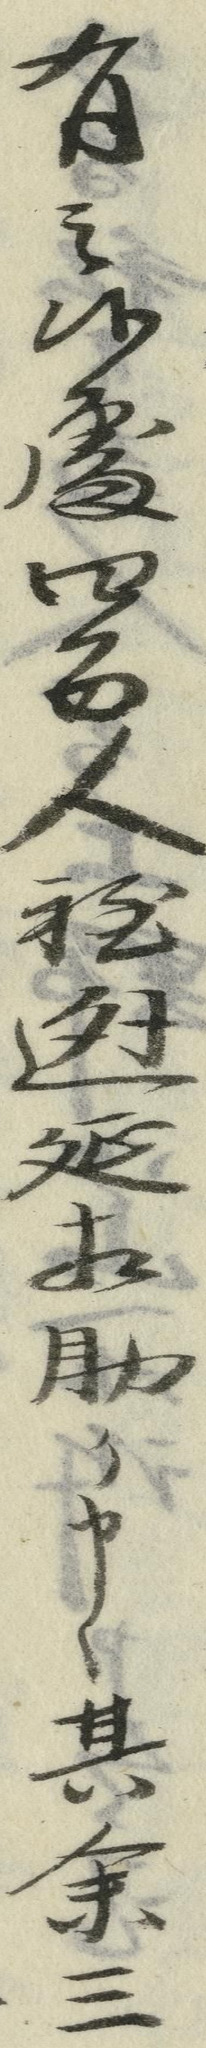有之候処四百人程逃延相助リ申候其余三
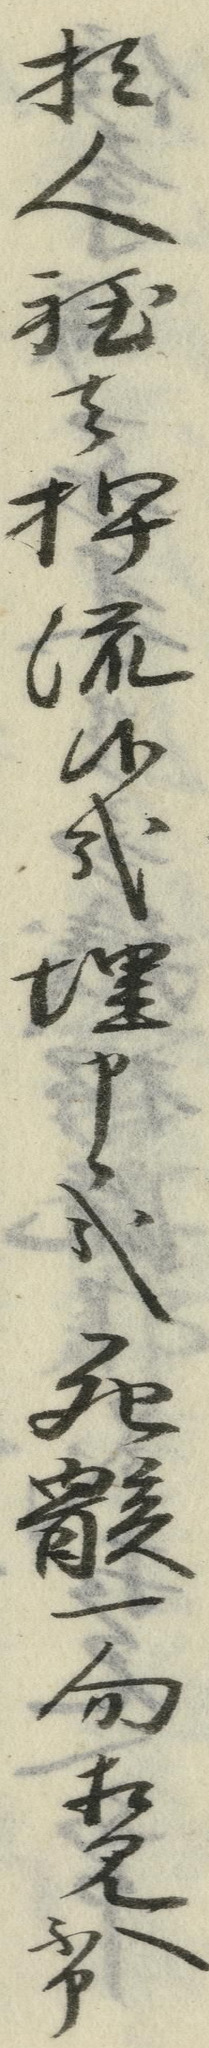拾人程は押流候哉埋申候哉死骸一向相見ヘ不申
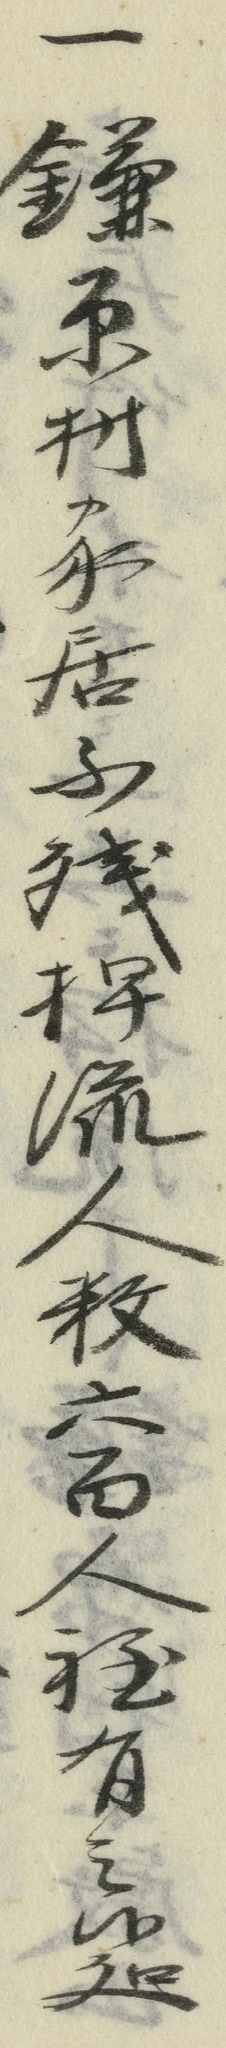一鎌原村家居不残押流人数六百人程有之候処
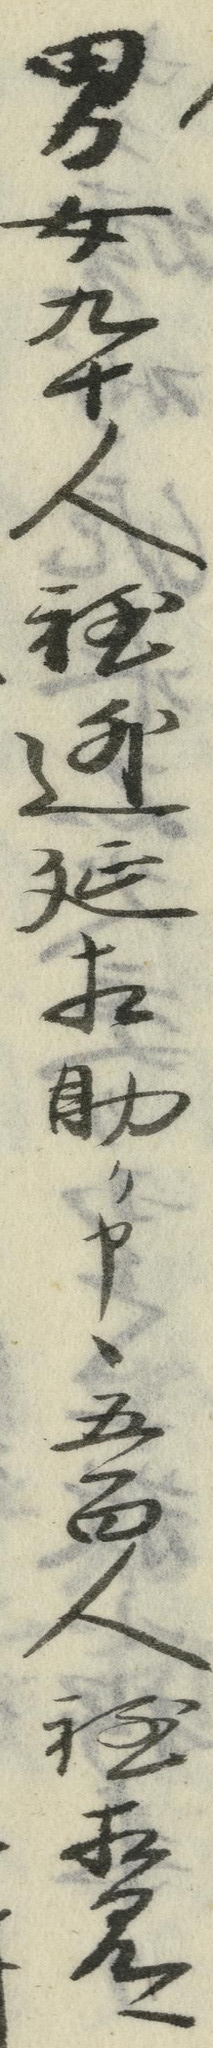男女九十人程逃延相助リ申候五百人程相見ヘ
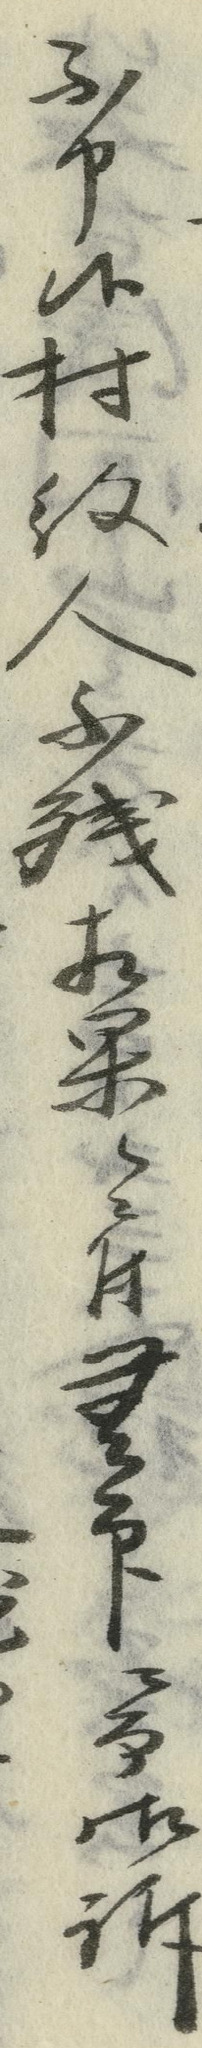不申候村役人不残相果候ニ付無印ニ而御訴
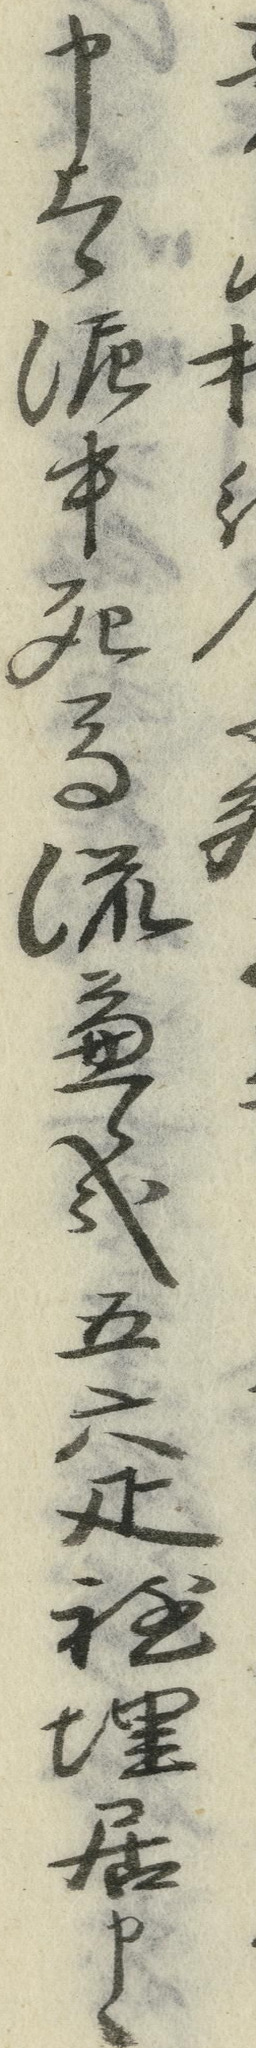申上候泥中死馬流兼候哉五六疋程埋居申候
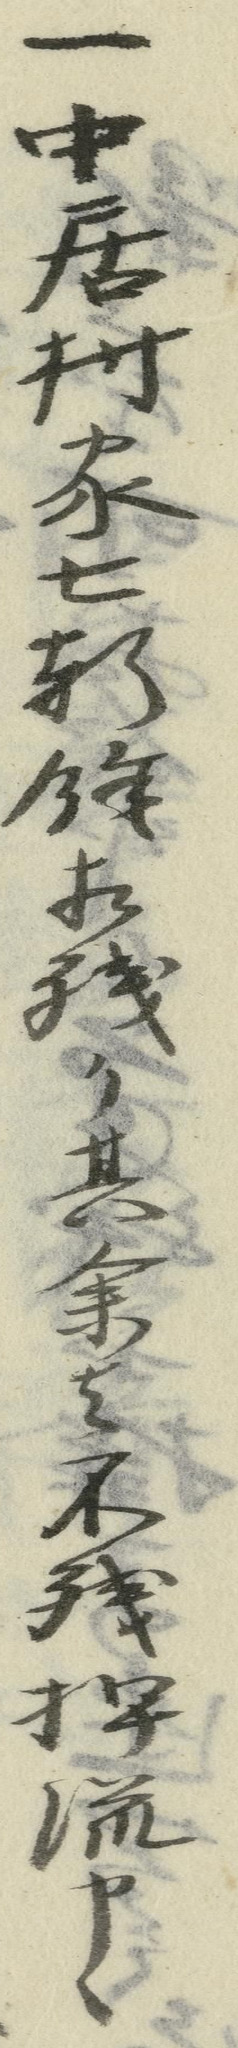一中居村家七軒余相残り其余は不残押流申候
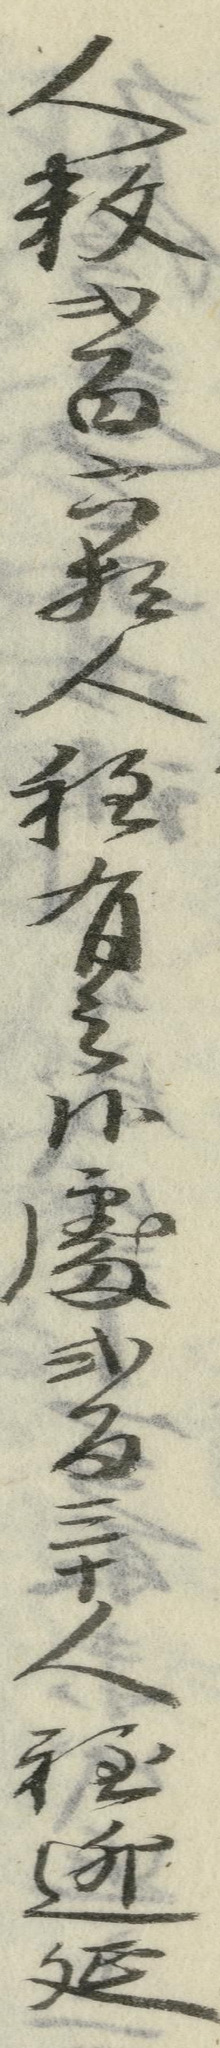人数弐百六拾人程有之候処弐百六三十人程逃延
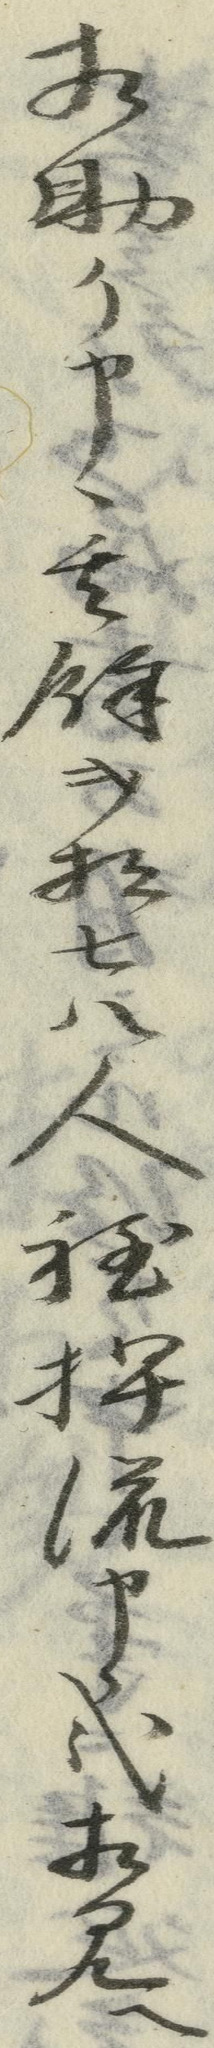相助リ申候其余弐拾七八人程押流申候哉相見ヘ
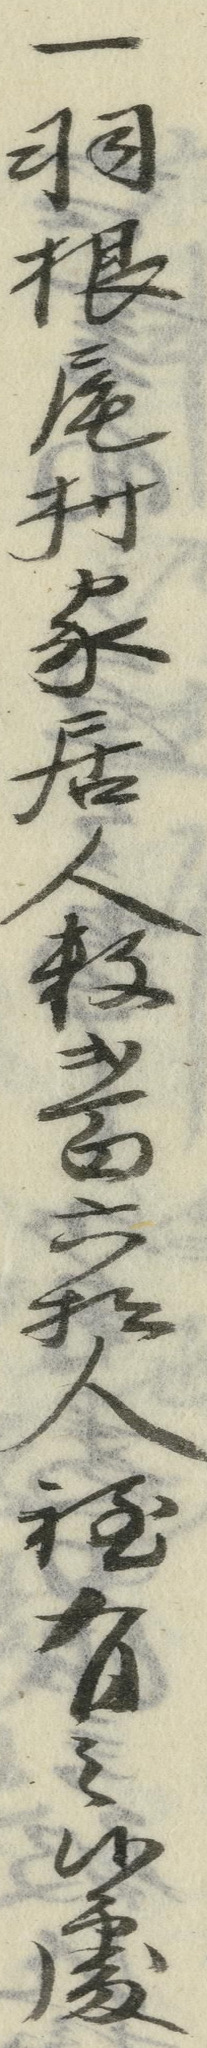一羽根尾村家居人数弐百六十人程有之候処
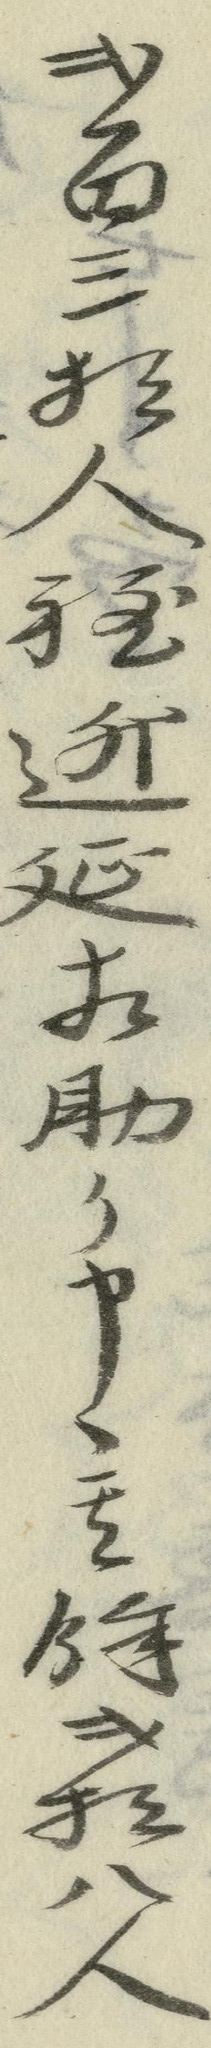弐百三拾人程逃延相助リ申候其余弐拾八人
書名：天明三癸卯七月信州浅間山焼出シ上州山津浪ニ付近國ヨリ御届書并訴書写
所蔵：東京大学地震研究所図書室 Earthquake Research Institute Library, The University of Tokyo, JAPAN
